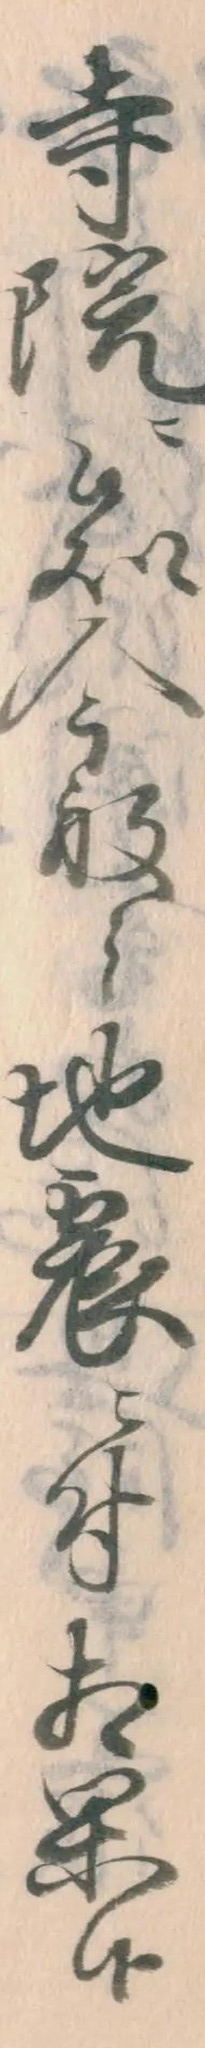寺院ニ候処今般之地震ニ付相果候
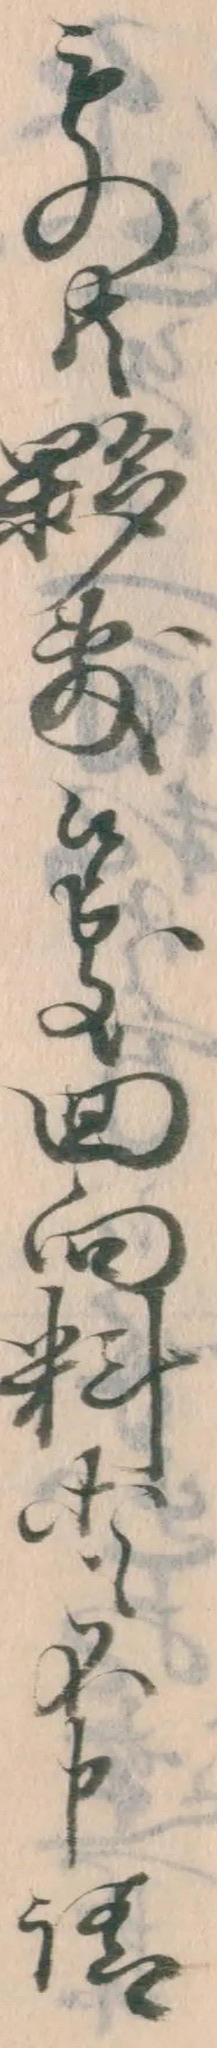もの共夥敷候処回向料等も不申請
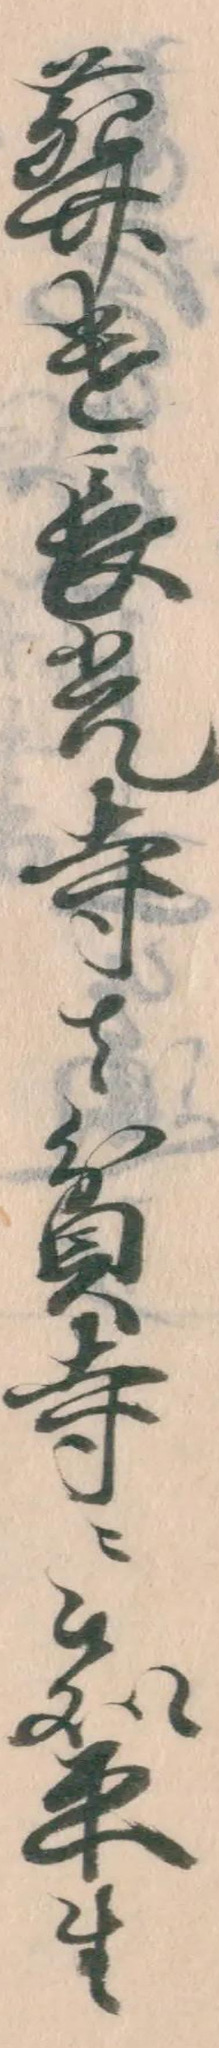葬遣長光寺は貧寺ニ候処平生
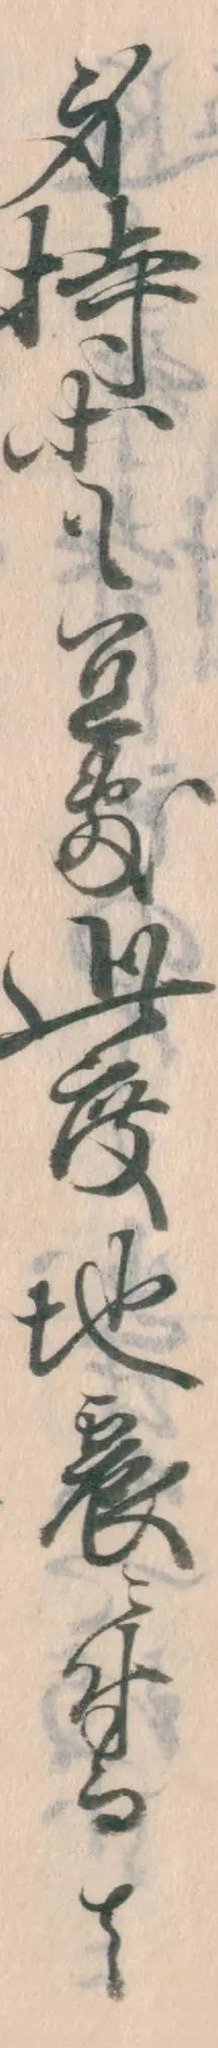身持等も宜敷此度地震ニ付而は
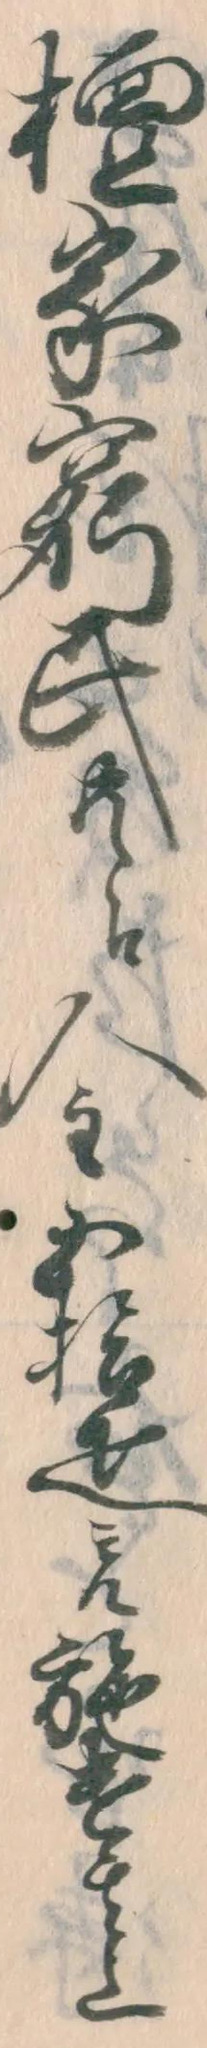檀家窮民共え金五拾疋宛施遣其上
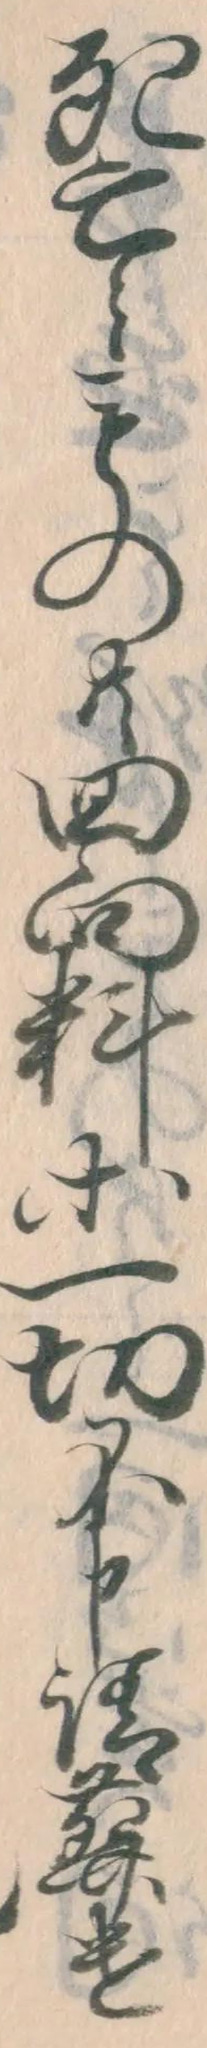死亡之もの共回向料等一切不申請葬遣
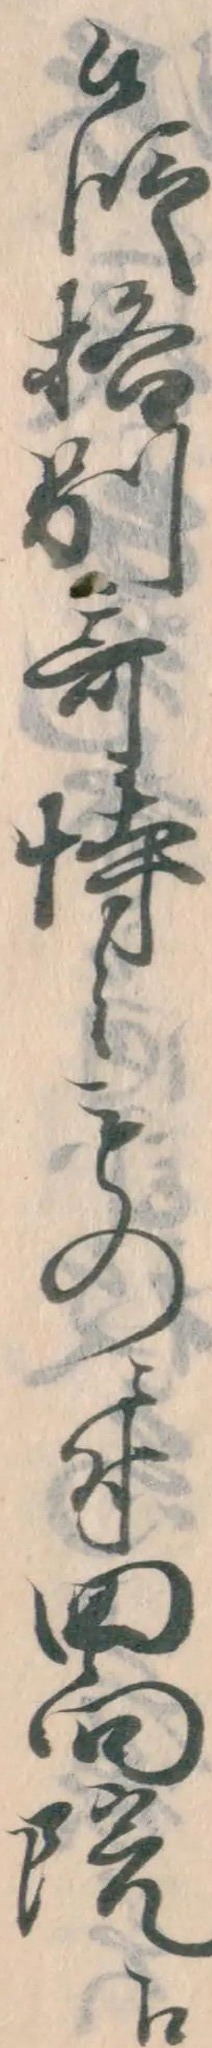候段格別奇特之ものニ付回向院え

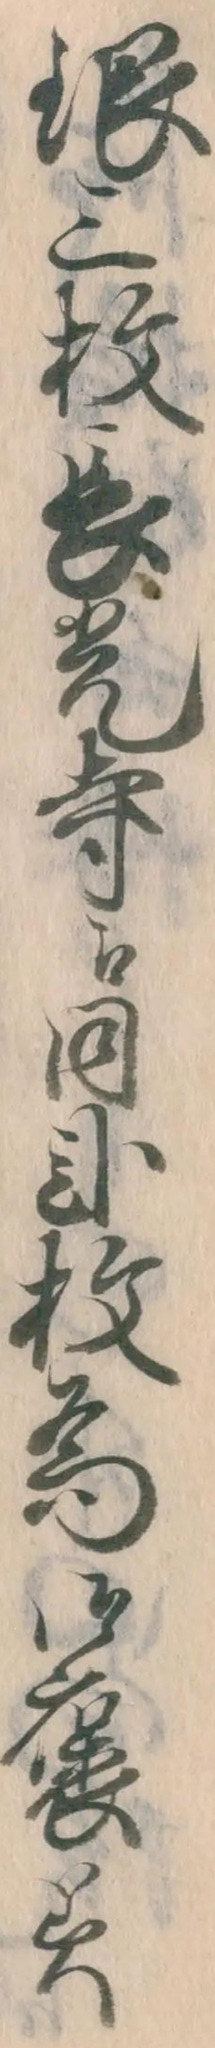銀三枚長光寺え同弐枚為御褒美
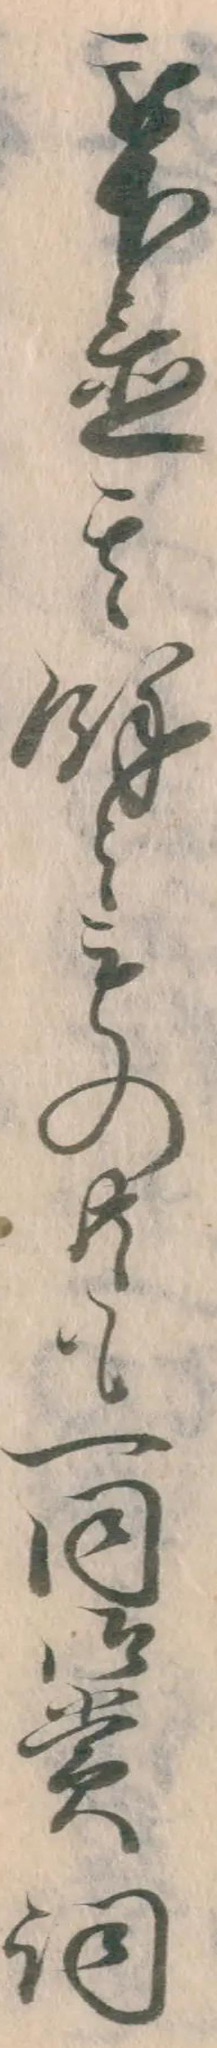被下置其余之もの共も一同御賞伺
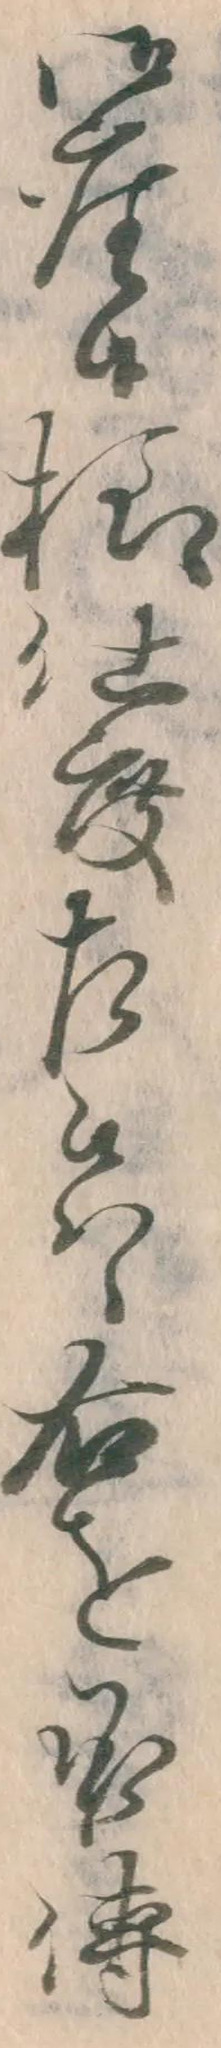御座候様仕度左候ハヽ右を承伝
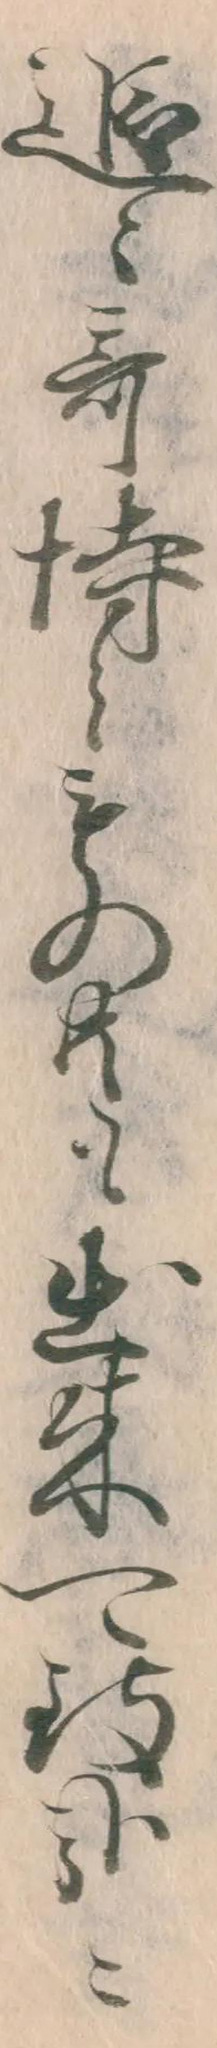追々奇特之もの共も出来可致哉ニ
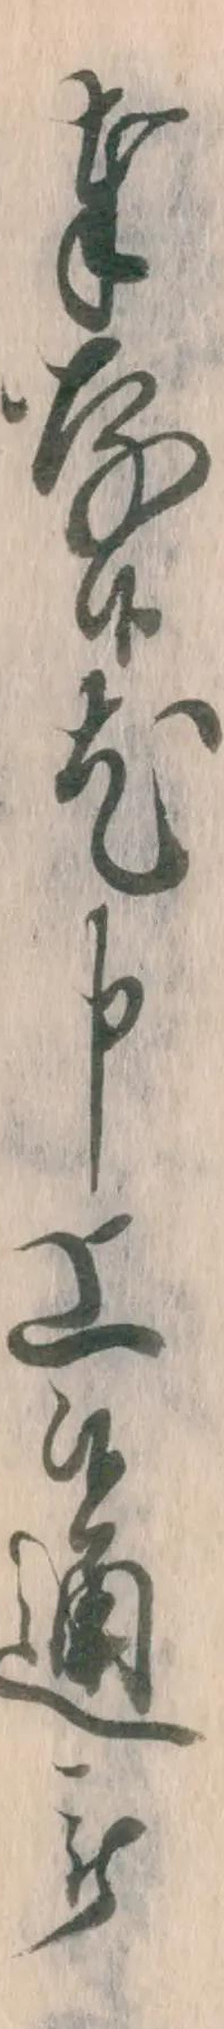奉存候尤申上候通被
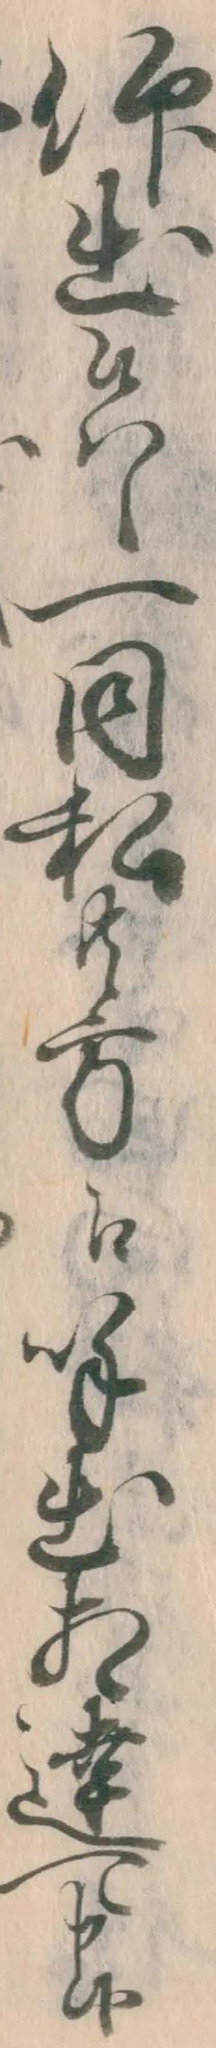仰出候ハヽ一同私共方え呼出相達可申候
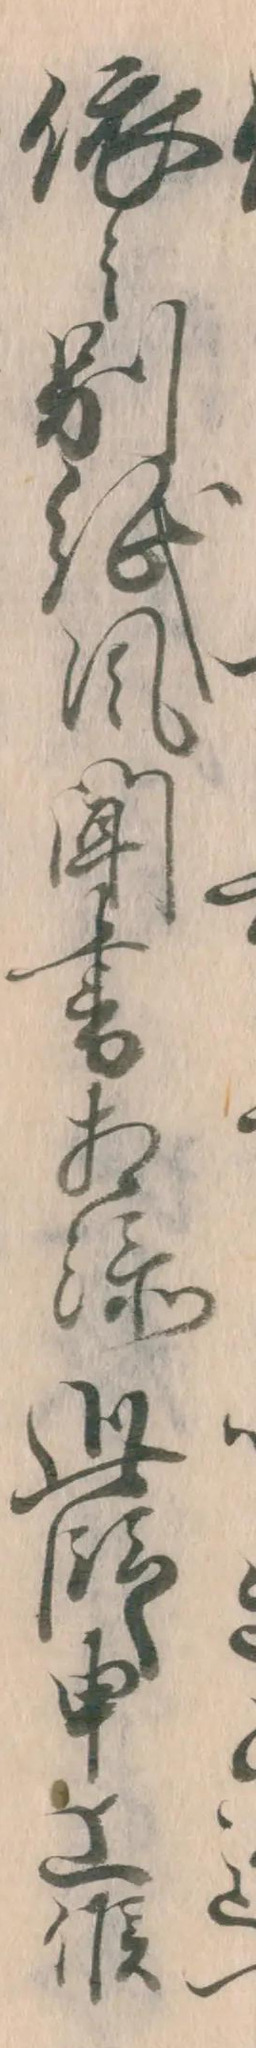依之別紙風聞聞書相添此段申上候
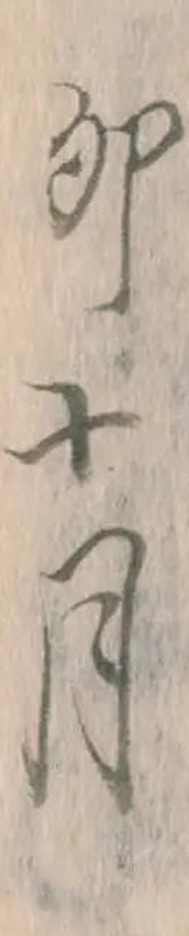卯十月
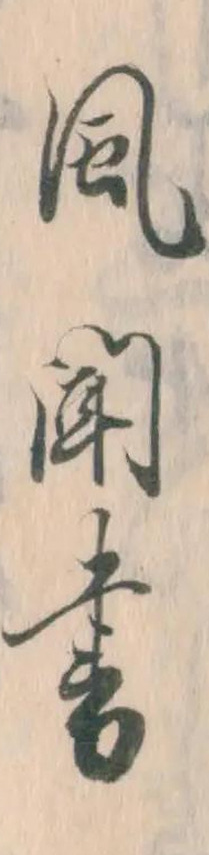風聞書
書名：武家方并寺院等ニテ施差出候一件
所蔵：国立国会図書館 National Diet Library, JAPAN
